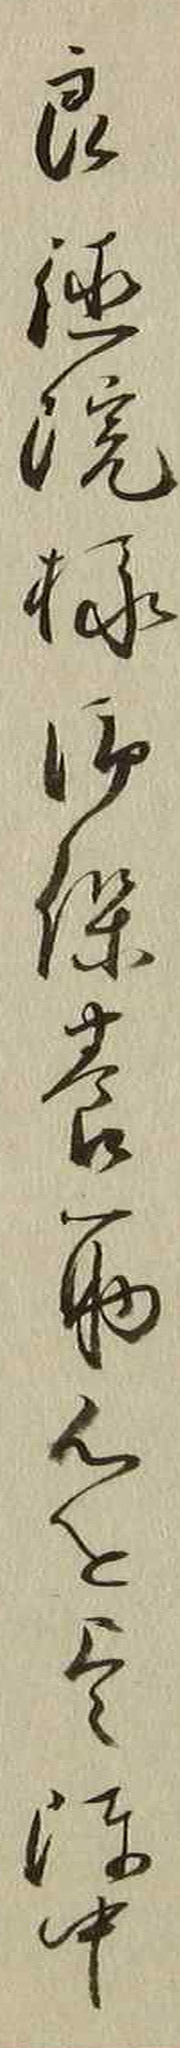良徳院様御保養筋心を尽陣中
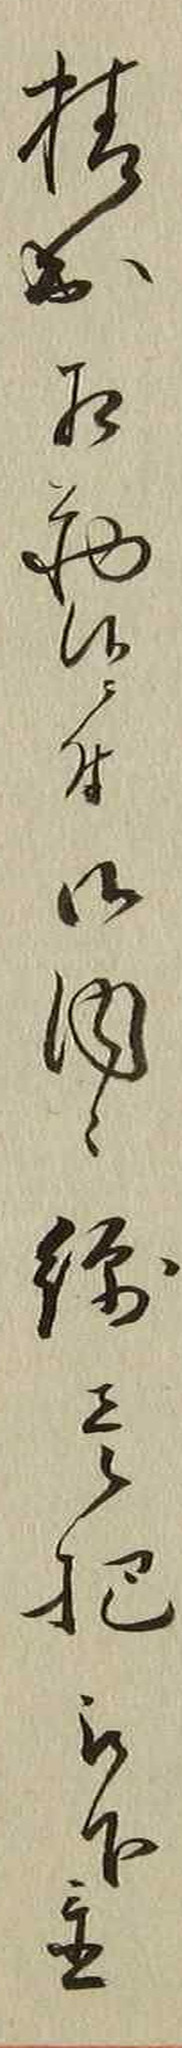精出相勤候ニ付御内々綿壱把被下置
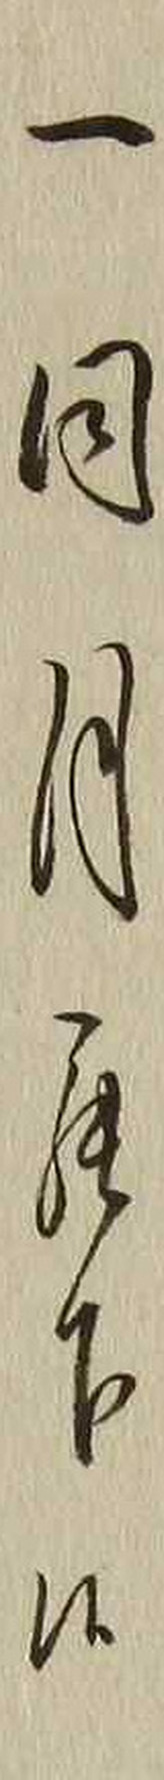一同月罷下候
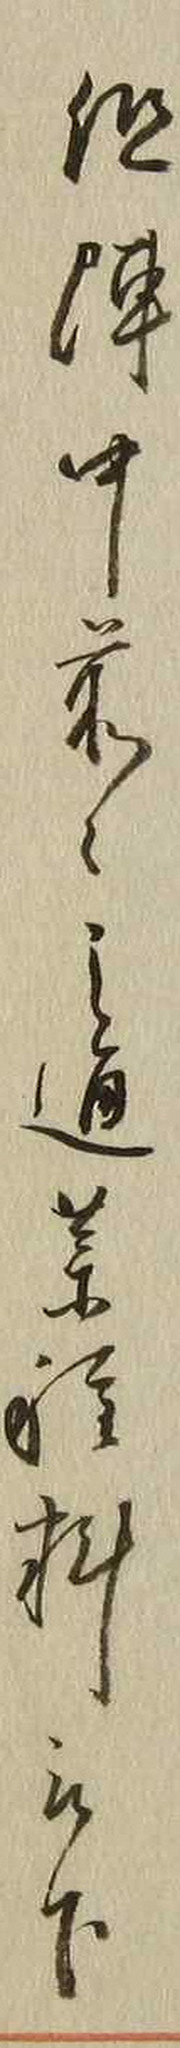但陣中前々之通薬種料被下
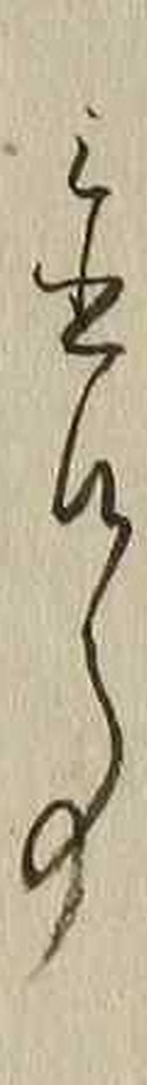置候事
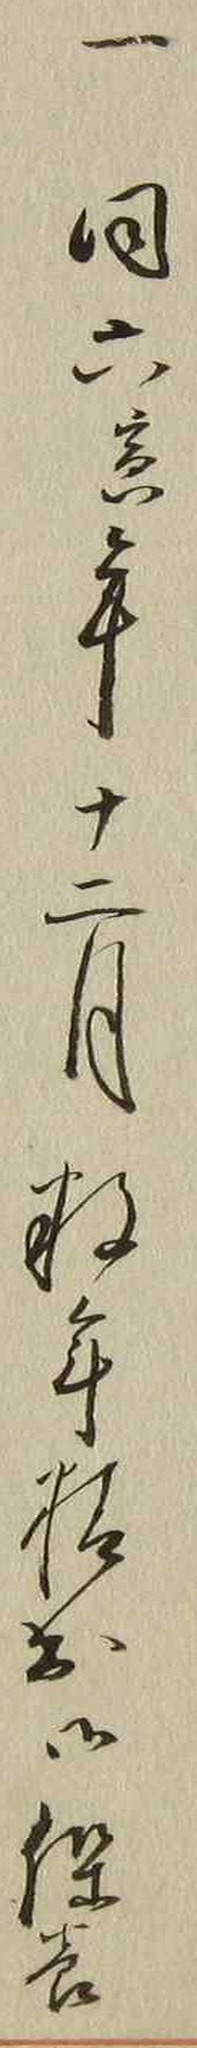一同六寅年十二月数年精出御保養
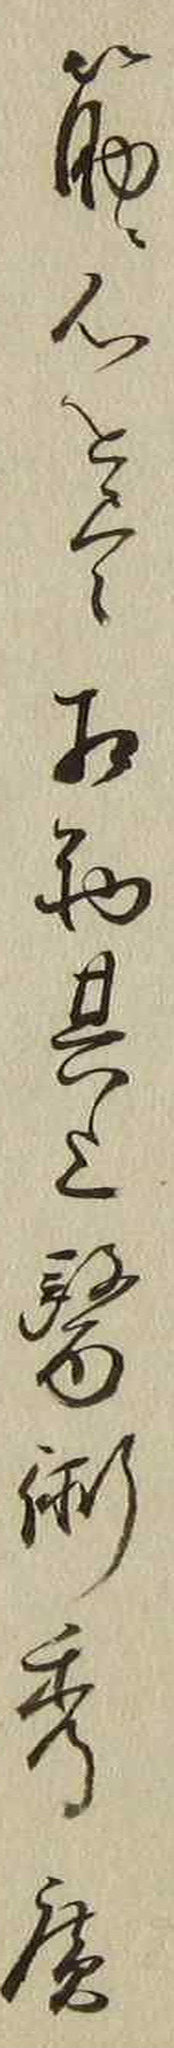筋ニ心を尽相勤其上医術秀廣
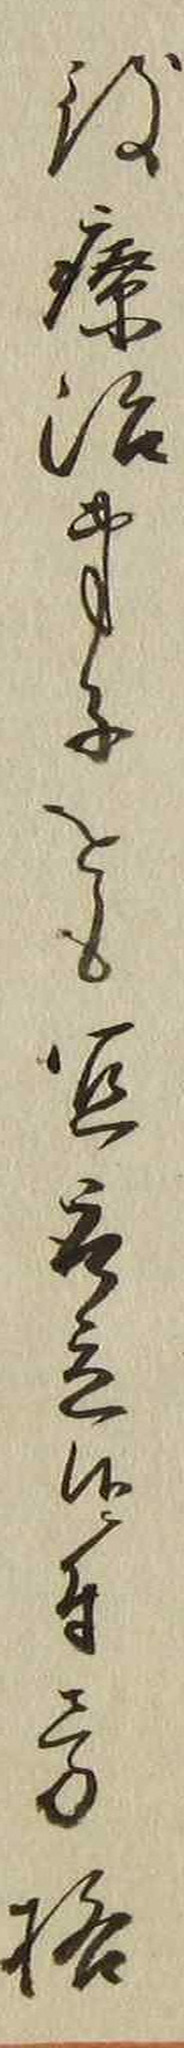致療治弟子をも宜取立候ニ付旁格
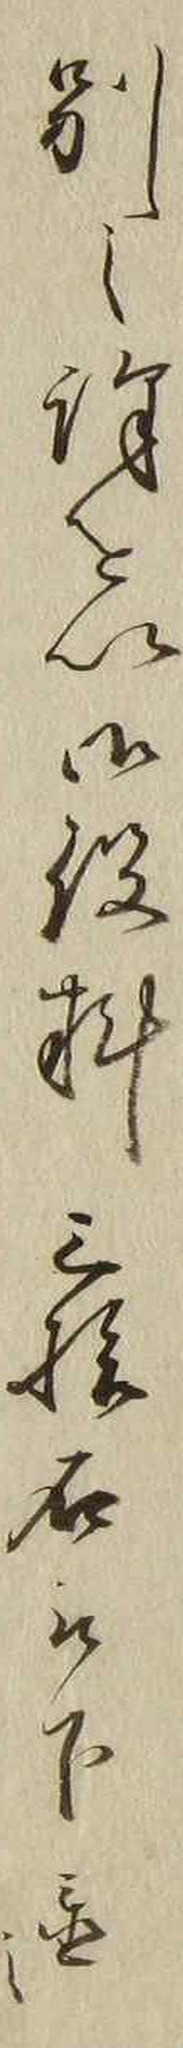別之訳を以御役料三拾石被下置
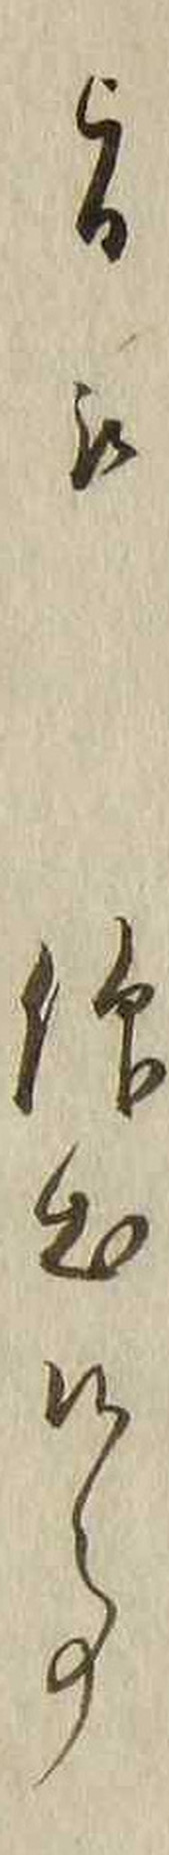旨被仰出候事
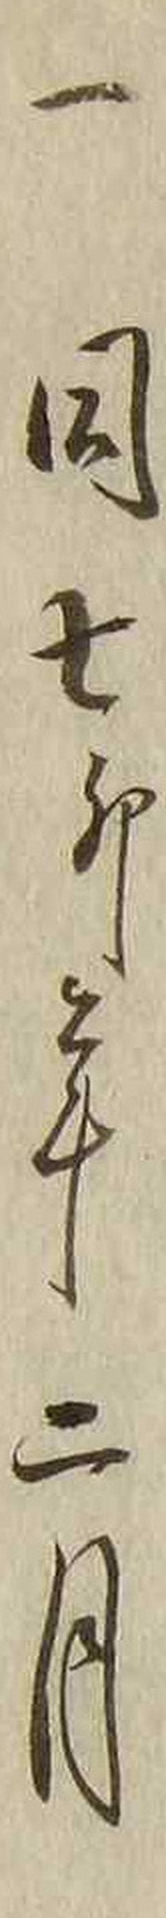一同七卯年二月

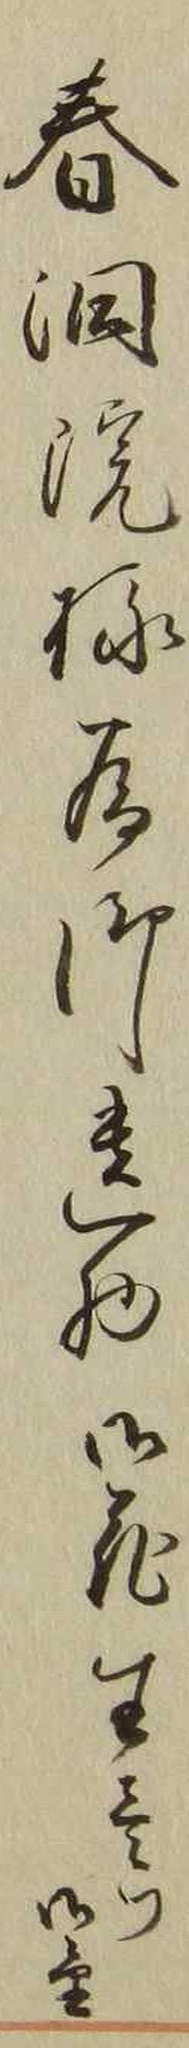春洞院様為御遺物御花生壱ツ御重
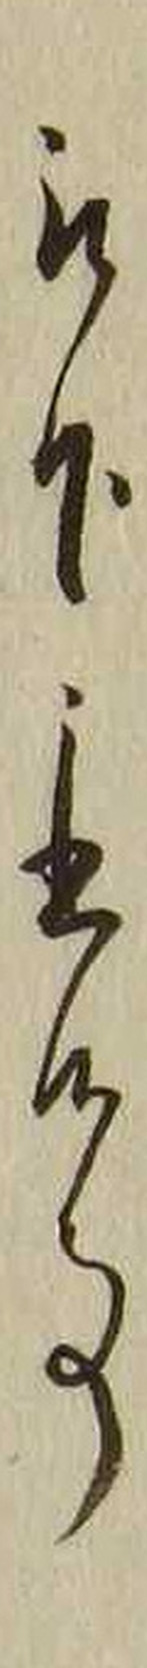被下置候事
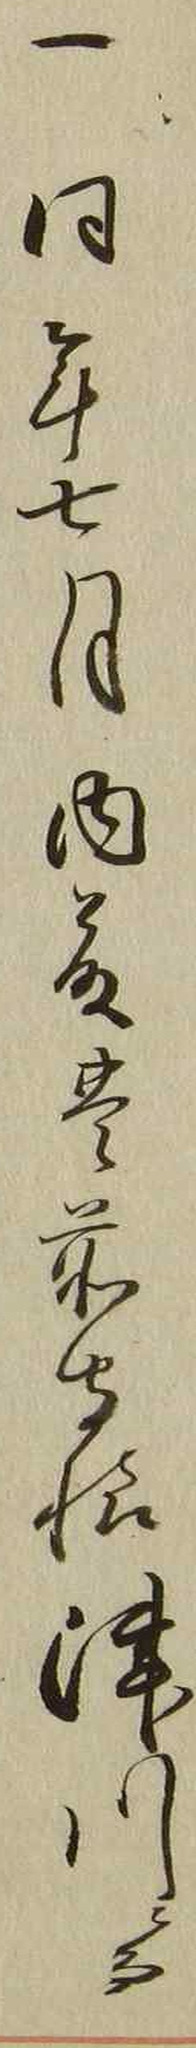一同年七月内藤豊前守様津川ニ而
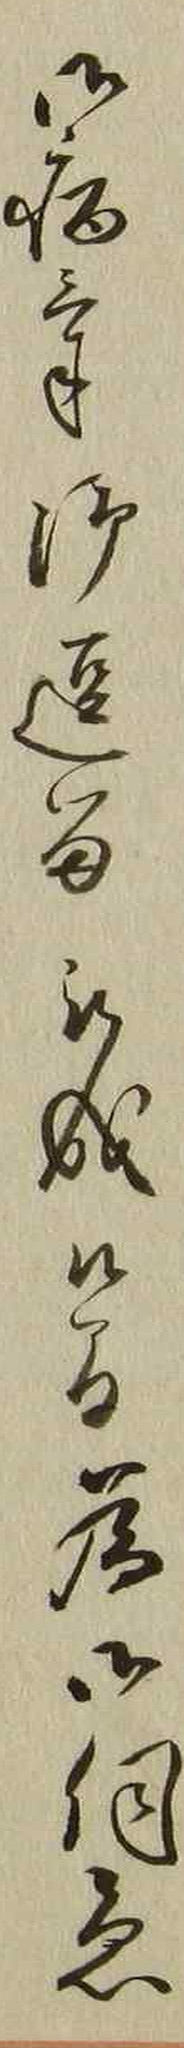御病気御逗留被成候間為御伺急
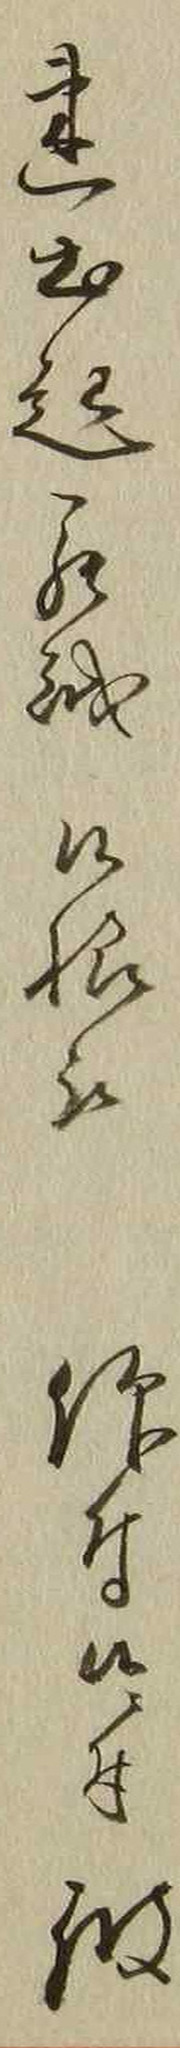速出起罷越候様被仰付候ニ付彼
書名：諸士系譜　巻之68　を之部2
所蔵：会津若松市立会津図書館
